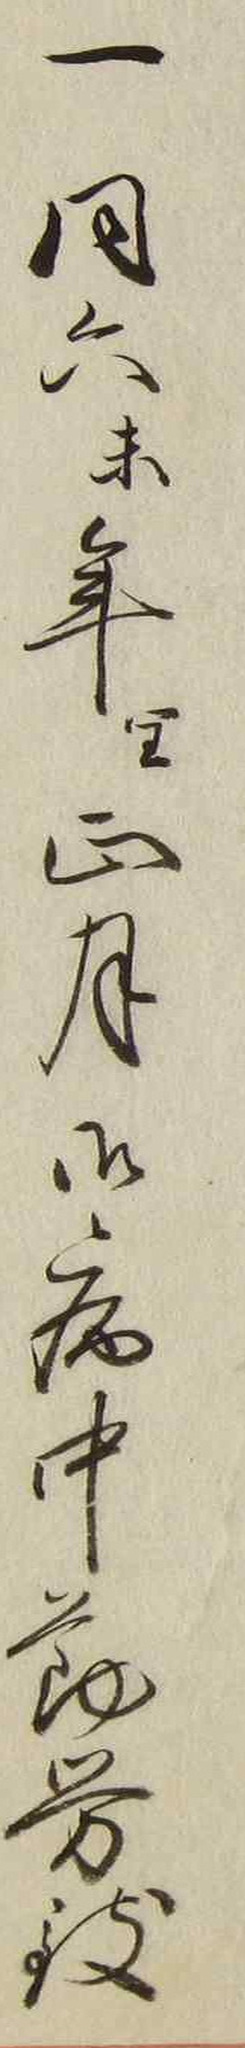一同六未年閏正月御病中勤労致

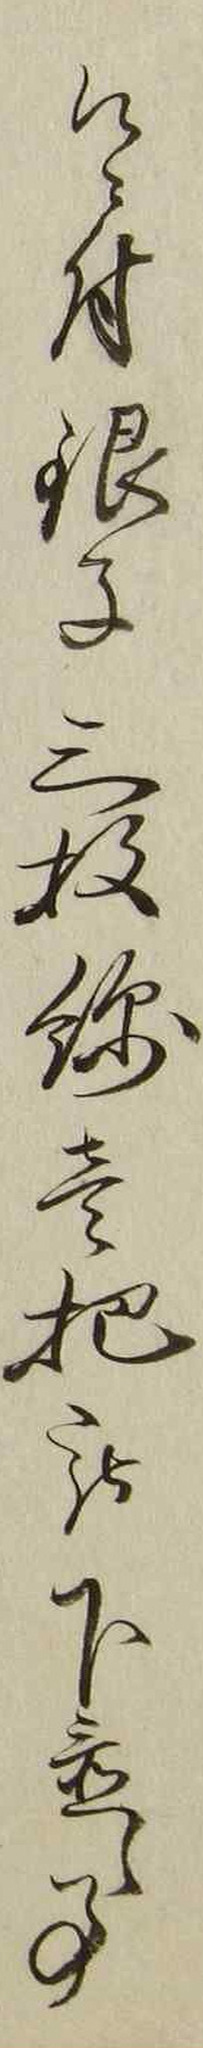候ニ付銀子三枚綿一把被下置候事
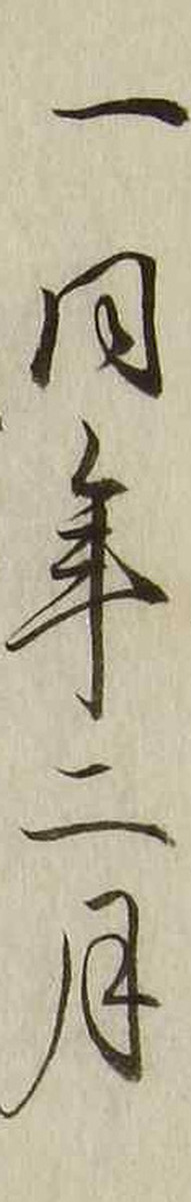一同年二月
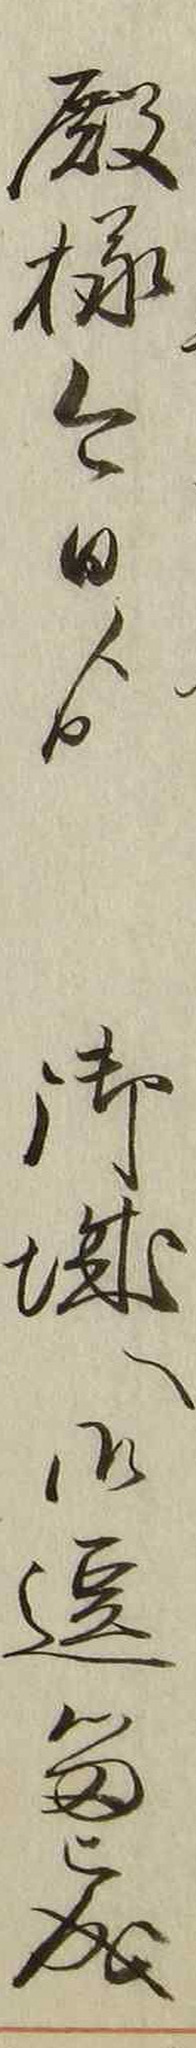殿様今日ゟ御城へ御逗留被成
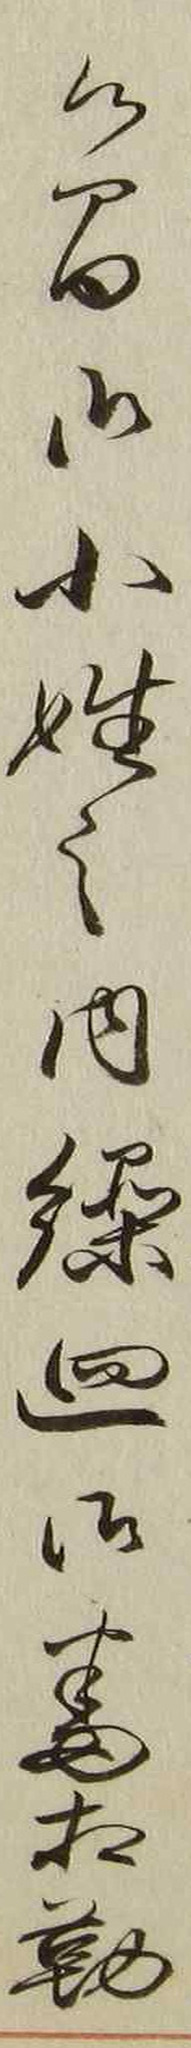候間御小姓之内繰廻御番相勤
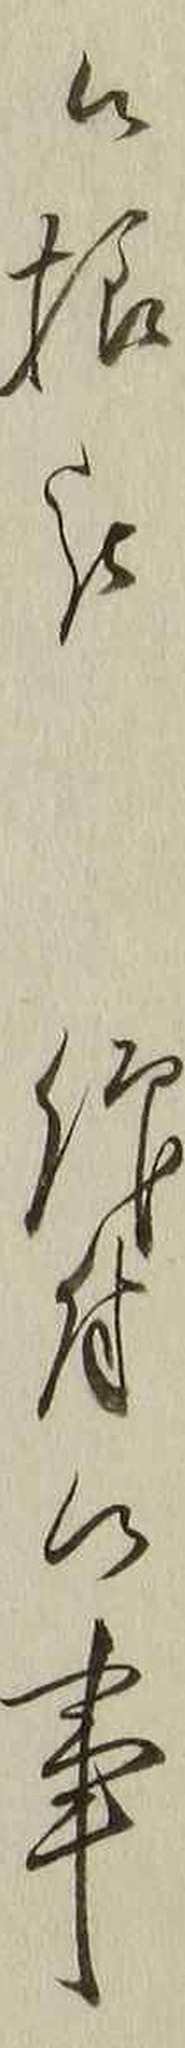候様被仰付候事
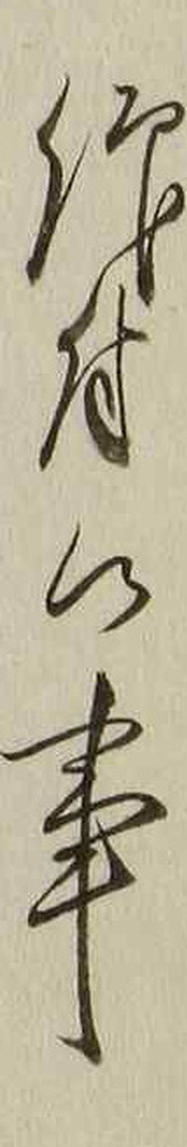仰付候事
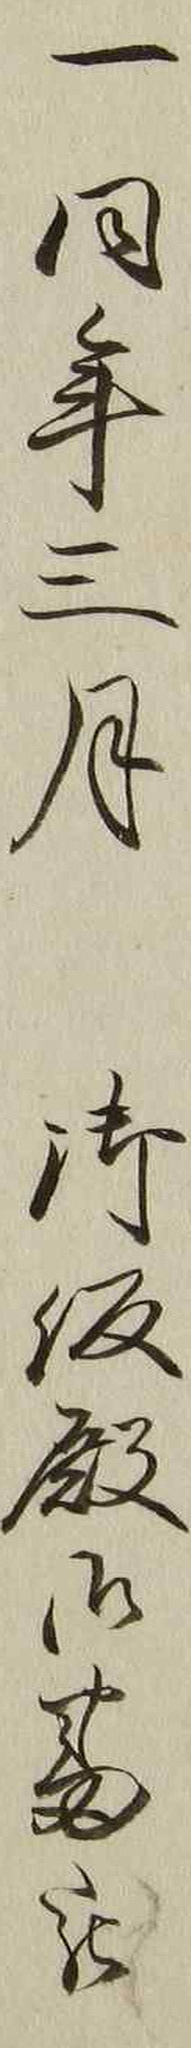一同年三月御仮殿御番被
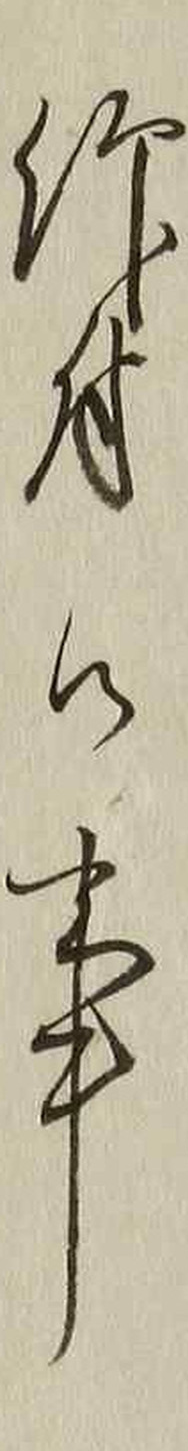仰付候事
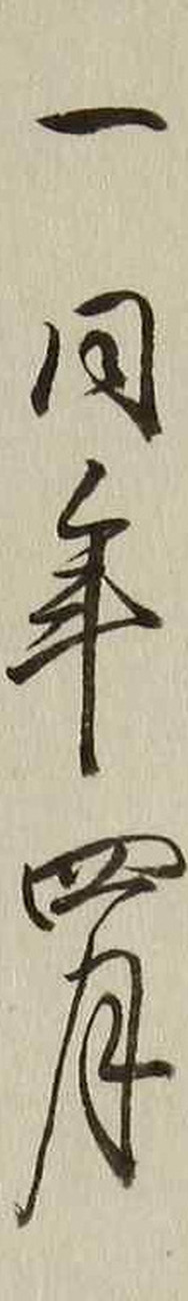一同年四月
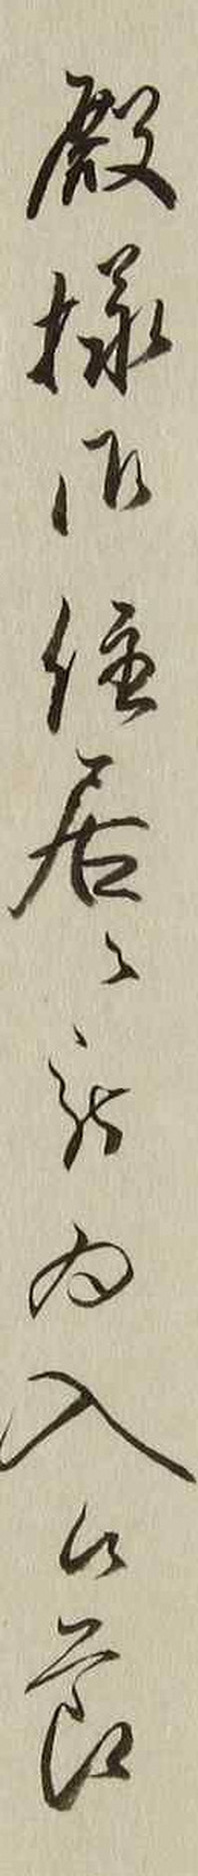殿様御住居へ被為入候節
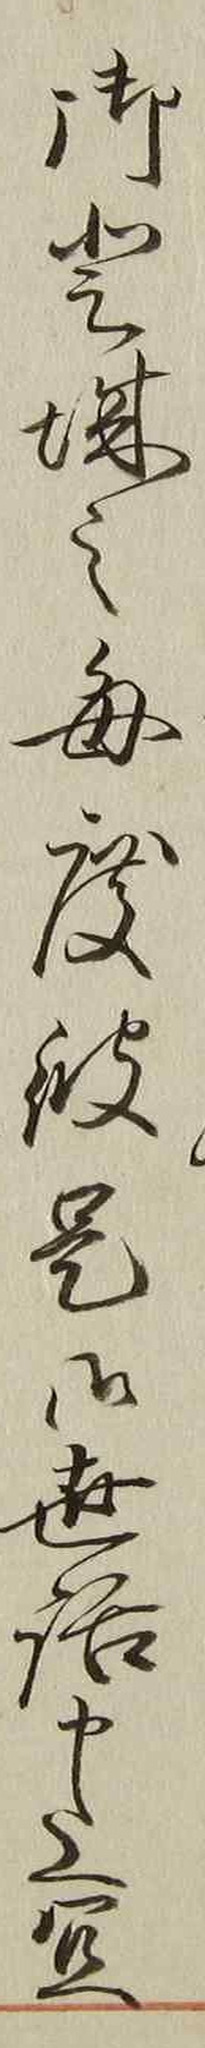御登城之毎度彼是御世話申上宜
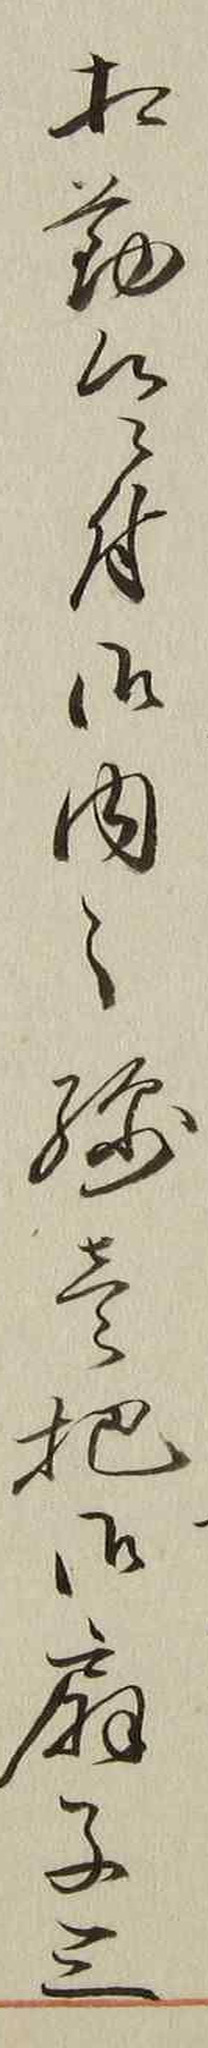相勤候二付御内々綿一把御扇子三
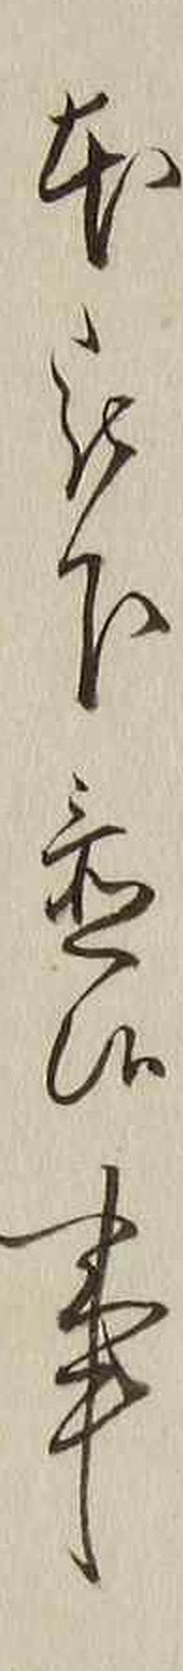本被下置候事
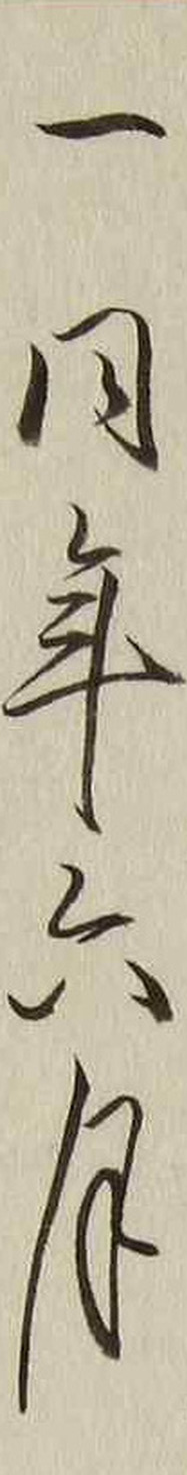一同年六月
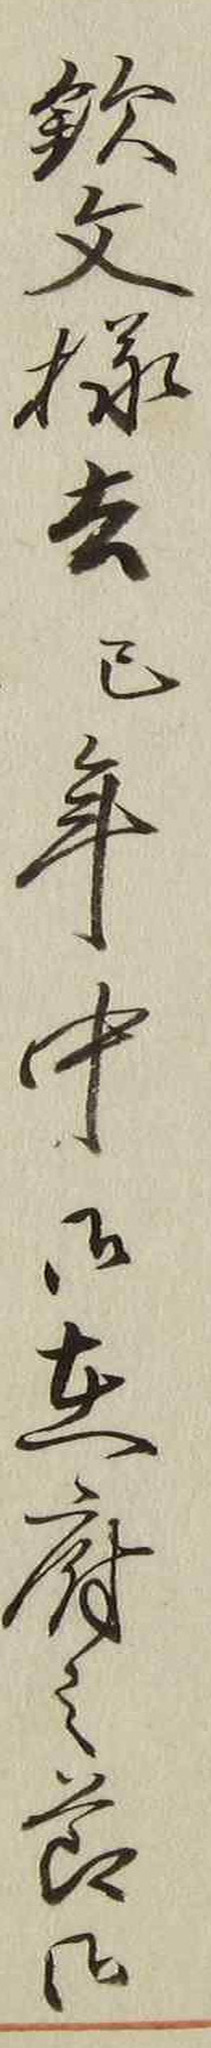欽文様去巳年中御在府之節御
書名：諸士系譜　巻之54　ほ之部1
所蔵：会津若松市立会津図書館
